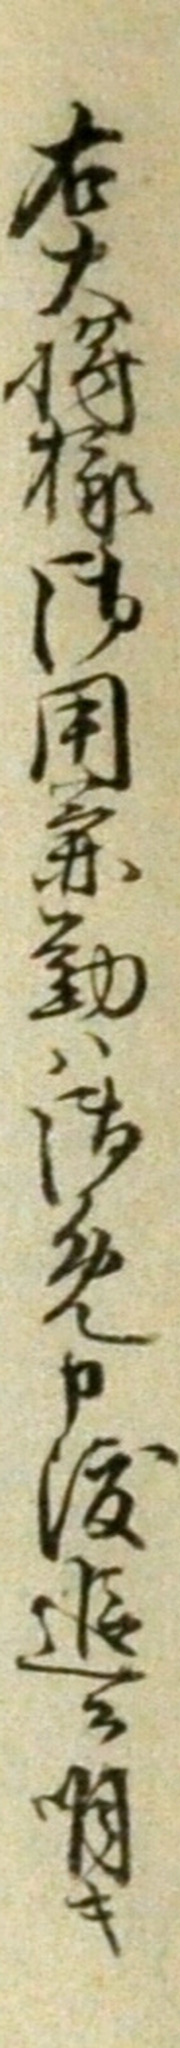右大将様御用兼勤ハ御免申渡追而明キ
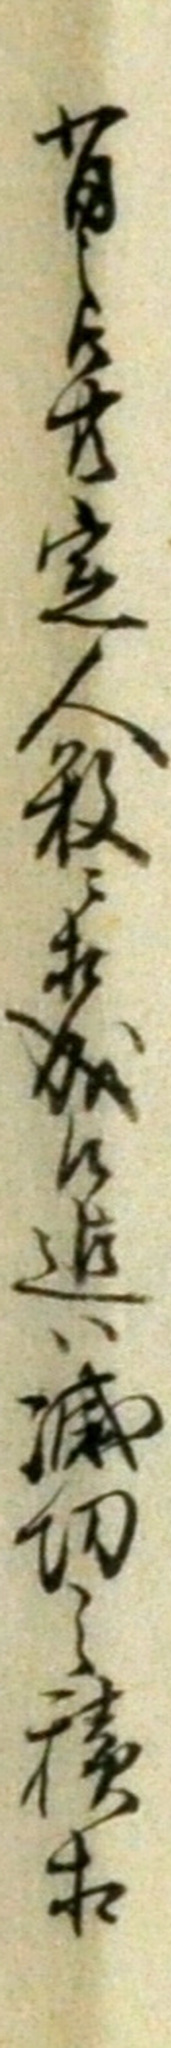有之候共定人数ニ相成候迄ハ滅切之積相
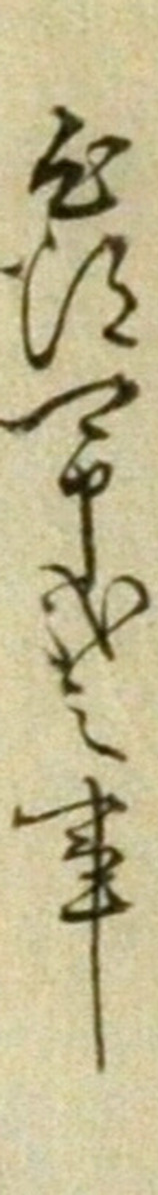心得可申哉之事
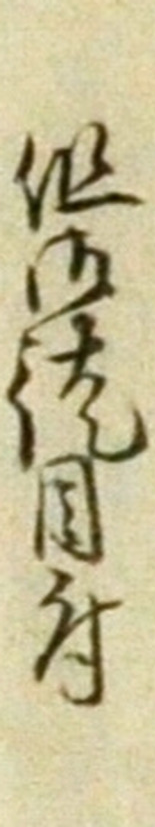但御徒目付
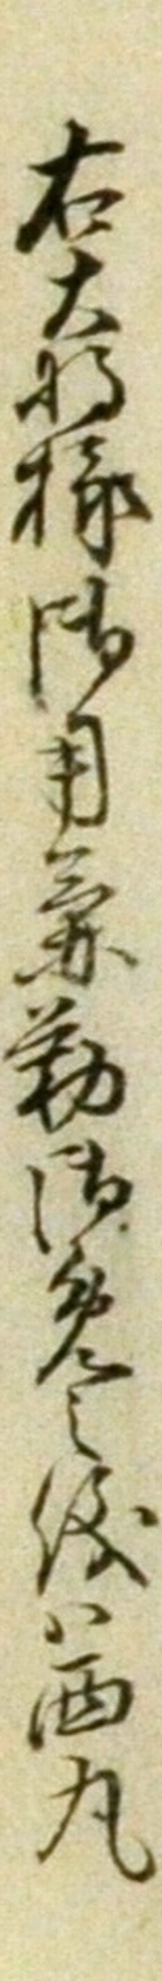右大将様御用兼勤御免之儀ハ西丸
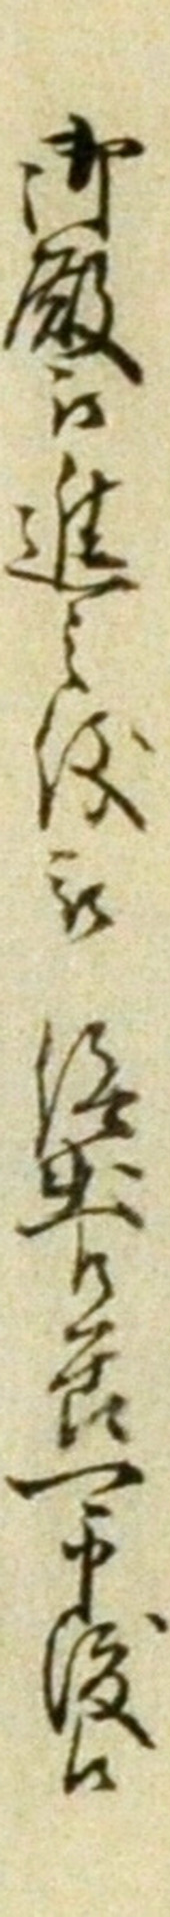御殿江進之儀被仰出候節可申渡候
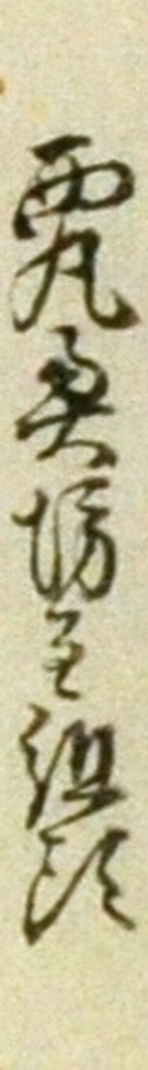西丸奥坊主組頭
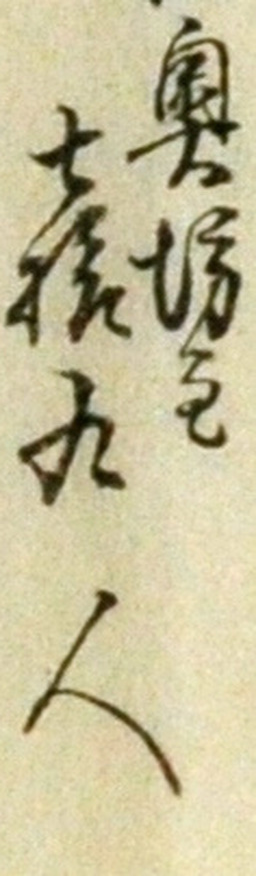七拾九人
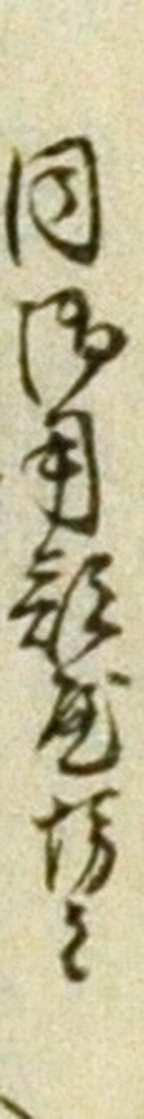同御用部屋坊主
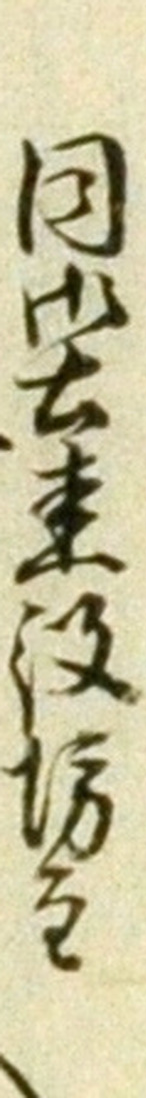同御土圭役坊主
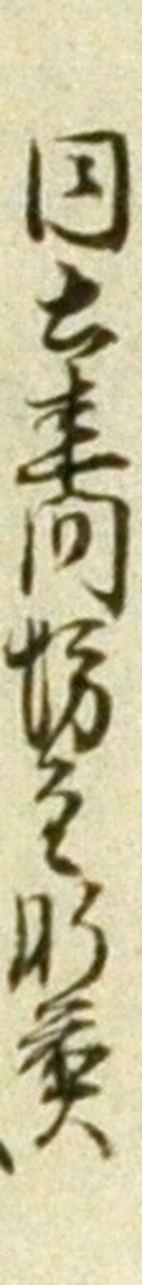同土圭間坊主肝煎
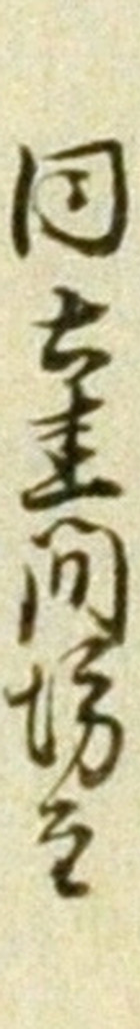同土圭間坊主
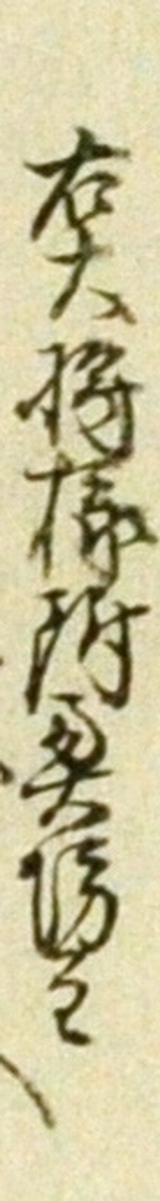右大将様附奥坊主
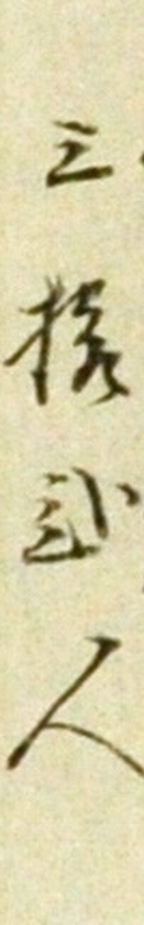三拾弐人
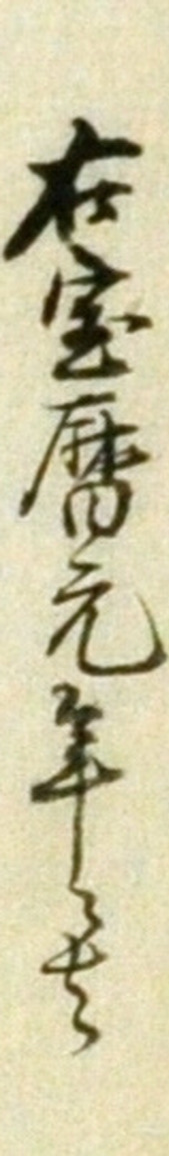右宝暦元年ニ者
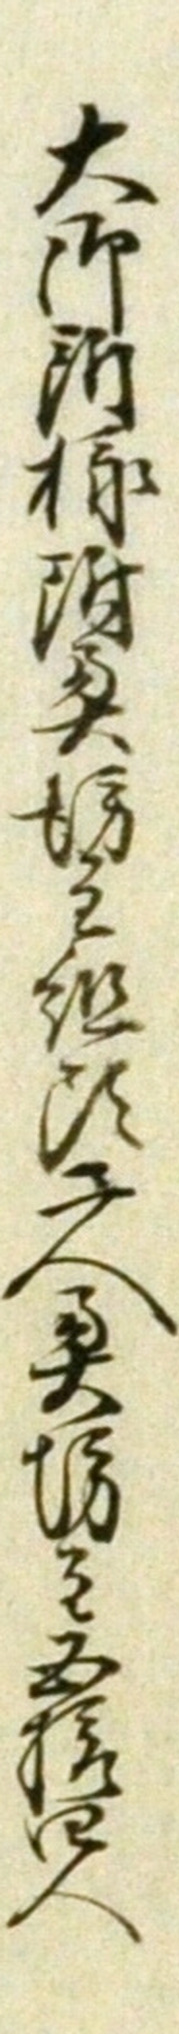大御所様附奥坊主組頭二人奥坊主五拾四人
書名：若年寄御役中御調書付
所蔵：伊那市立高遠町図書館・合同会社AMANE
